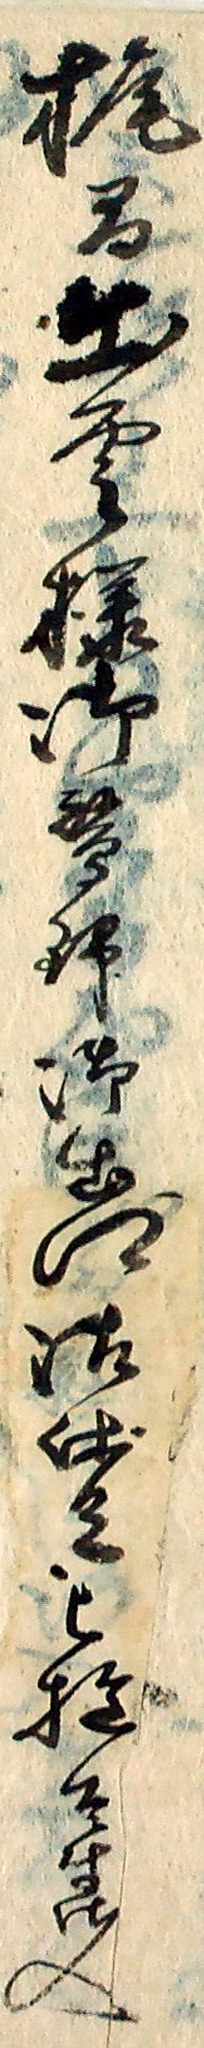梶間出雲様御鷹野御出郷御休足被遊候に付御入
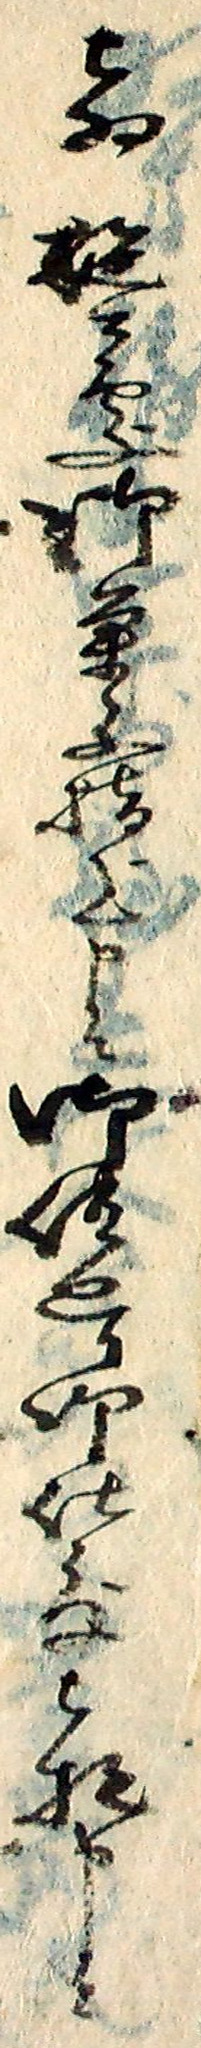被為遊候処御菓子指上申候御供廻り御仕度被遊申候
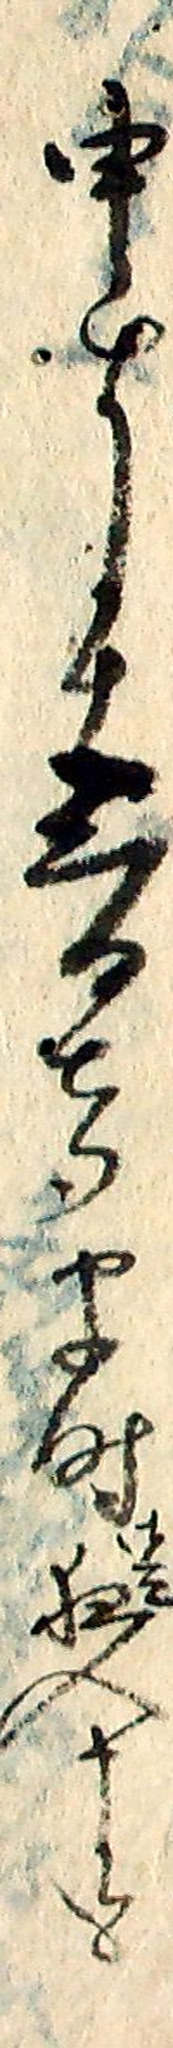申十月十三日七つ半時御立夜入申候
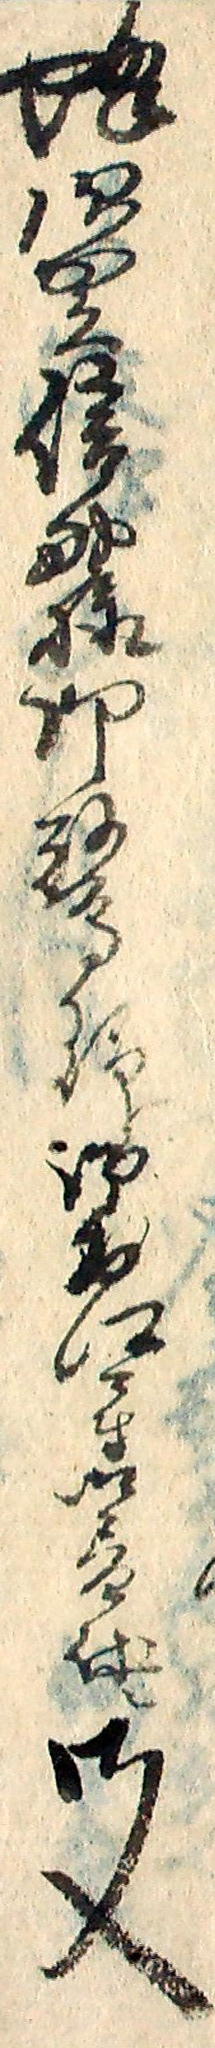蜂須賀信濃様御鷹野御出郷に付御昼休に御入
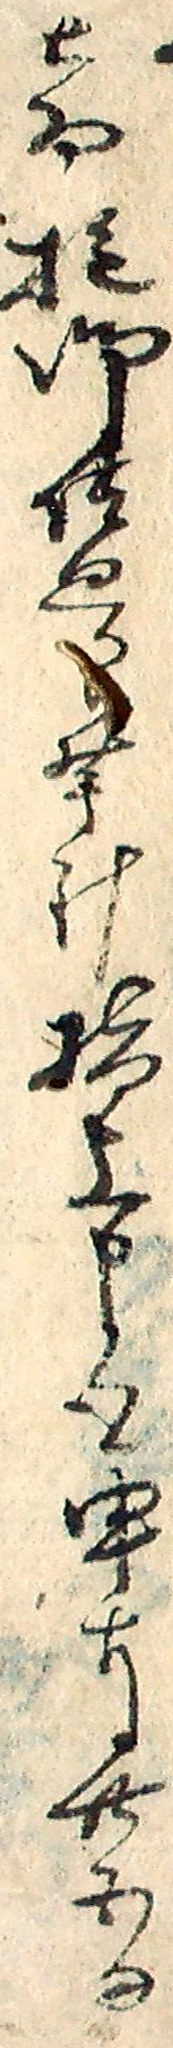被為遊御供廻りえ芋汁指上申候申十月廿五日

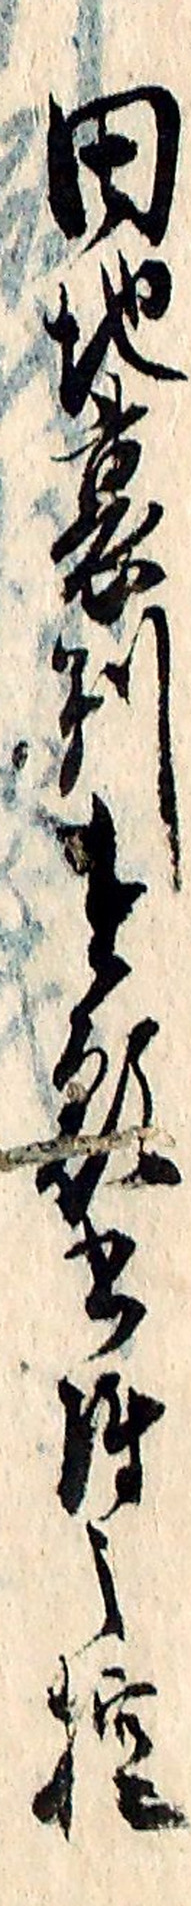田地裏判奉願書附之控
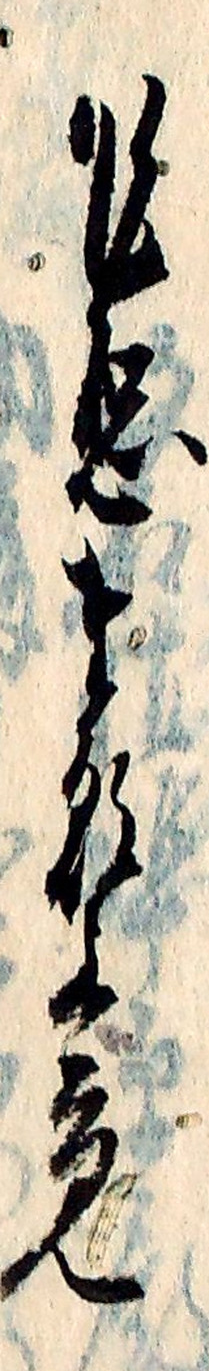乍恐奉願上覚
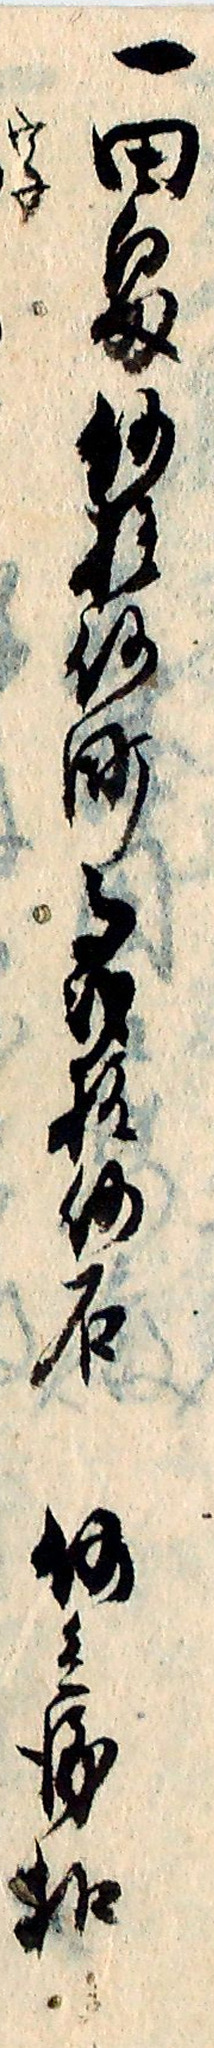一田畠何拾何町高弐拾何石何兵衛扣
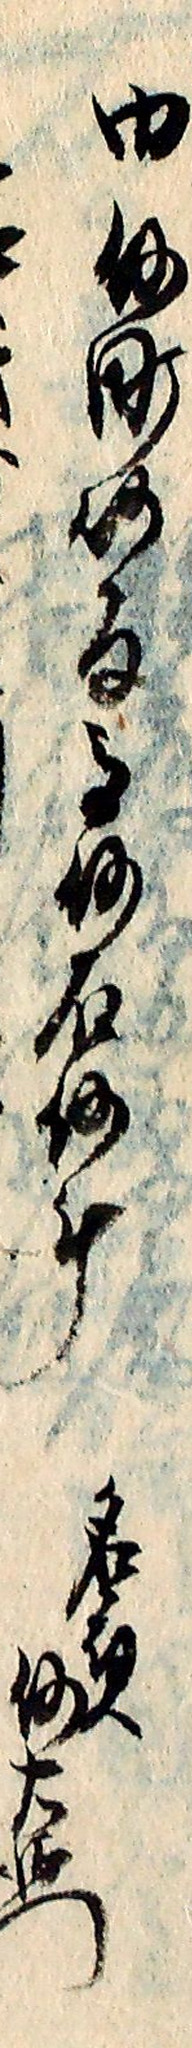内何町何反高何石何斗何右衛門
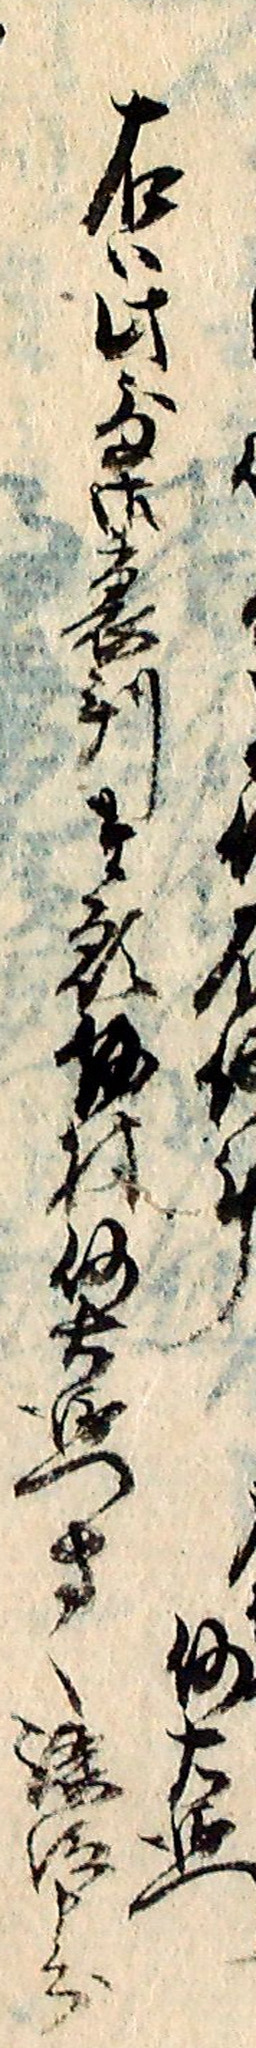右は此度御裏判奉願何村何右衛門方へ譲渡申分
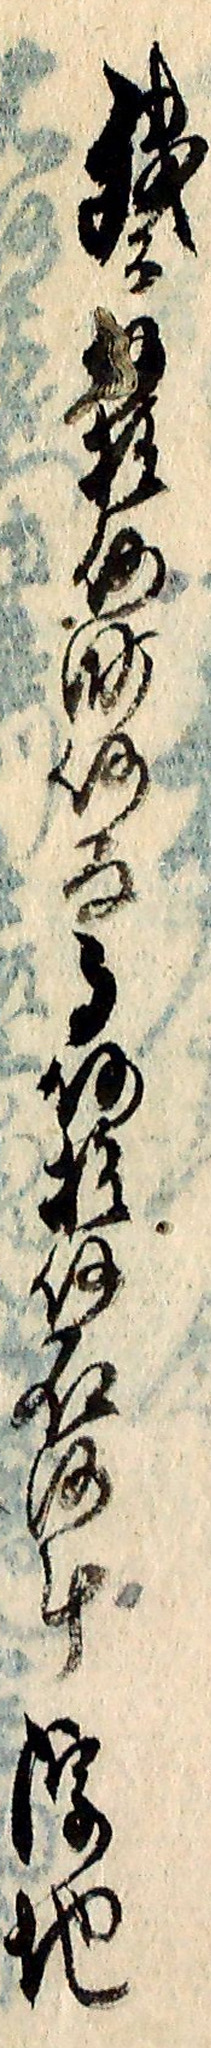残て何拾何町何反高何拾何石何斗浮地
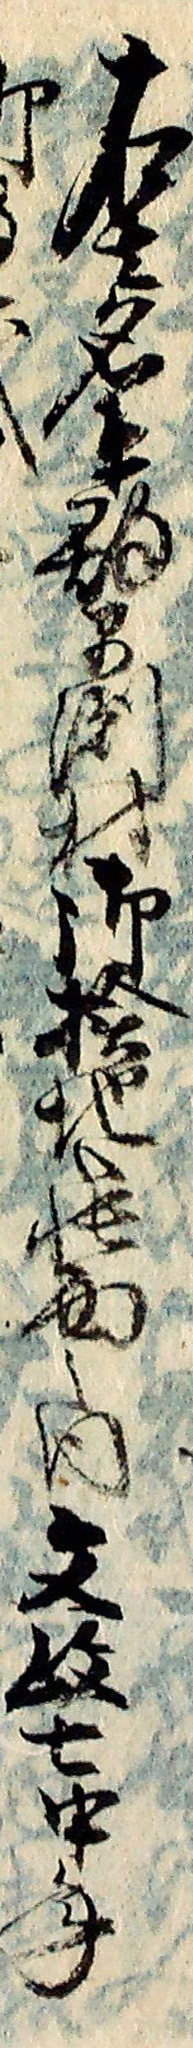右は名東郡早淵村御検地御帳面之内文政七申年
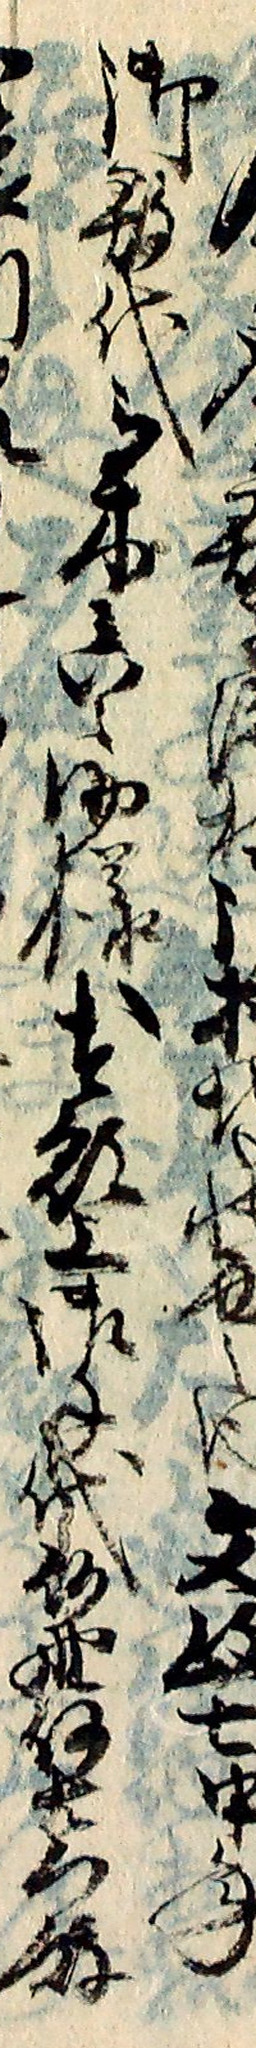御郡代高木真之助様へ奉願上御手代何野何右衛門殿
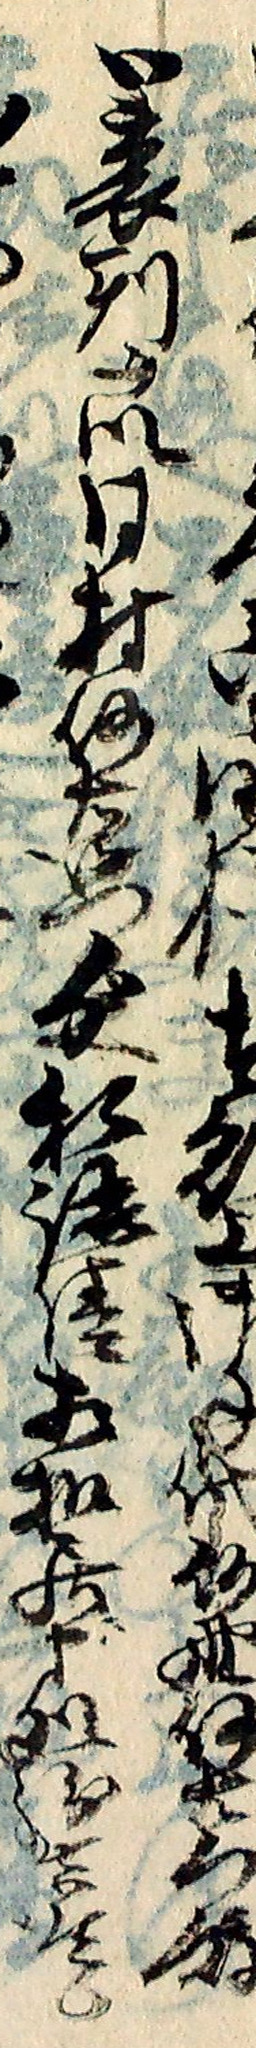御裏判を以同村何右衛門ゟ私譲請相扣居申処紛無御座候
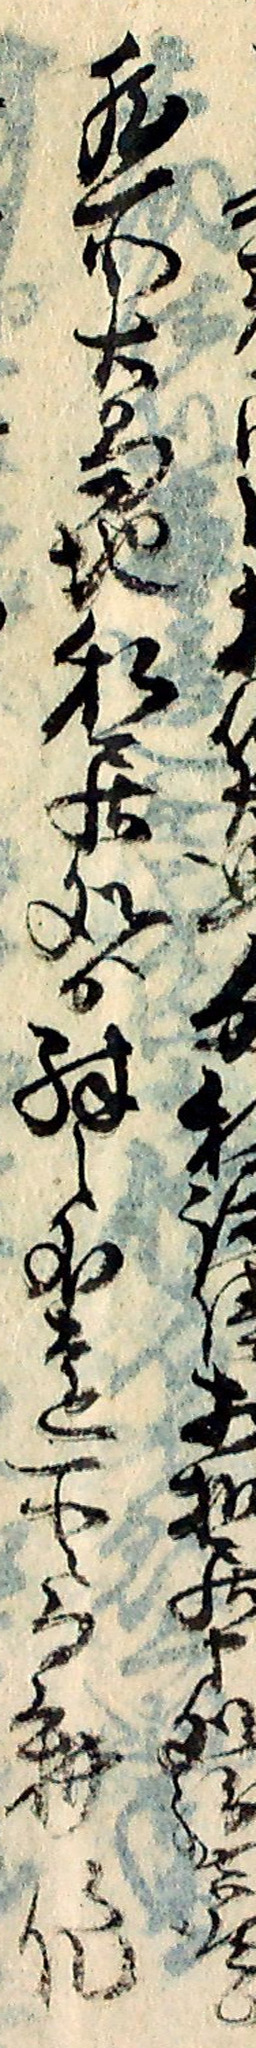然所右畠地私居処ゟ殊之外遠所にて耕作
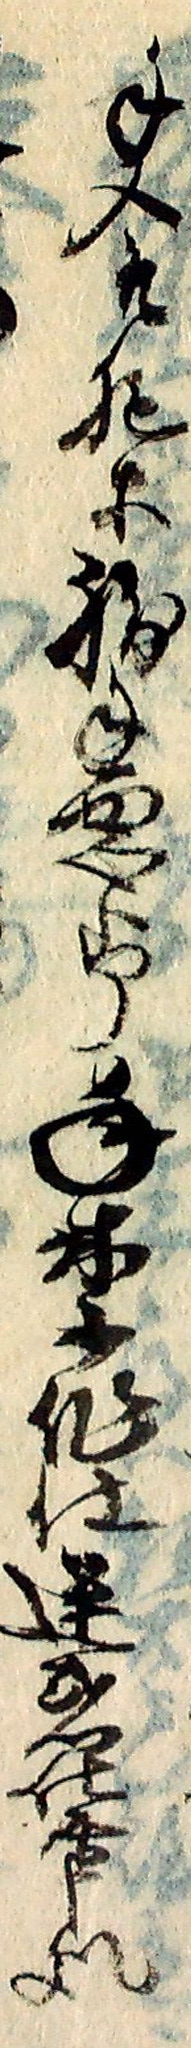手入并肥等勝手悪布年季作仕迷惑仕居申処
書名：諸御願書控(後藤氏壱番）
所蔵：鳴門教育大学 Naruto University of Education
